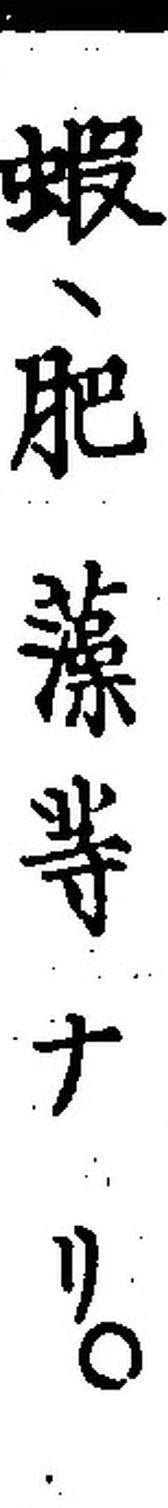蝦・肥藻等ナリ。
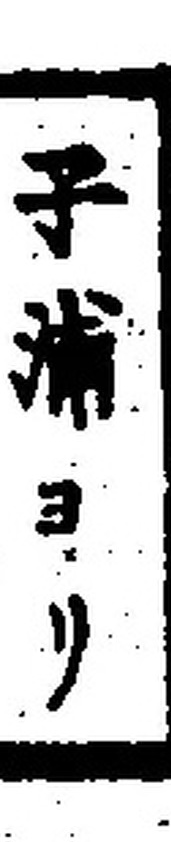子浦ヨリ
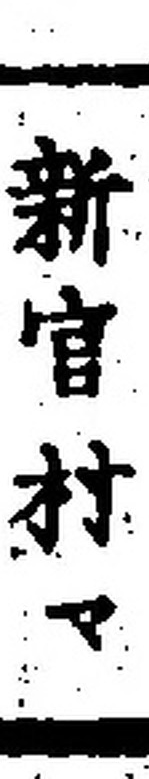新宮村マ
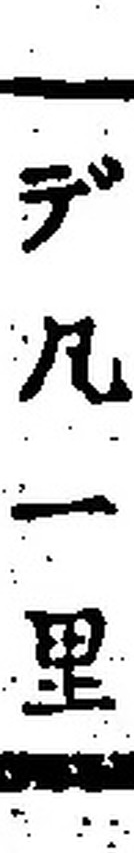デ凡一里
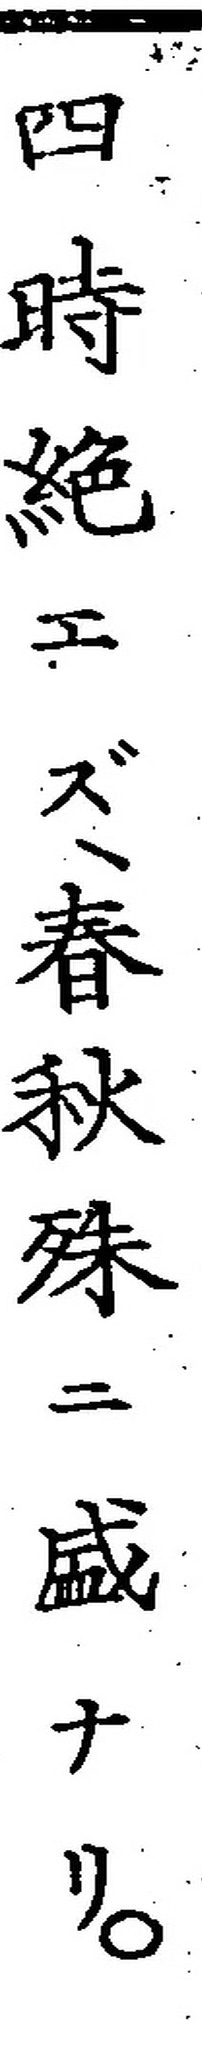四時絶エズ、春秋殊ニ盛ナリ。
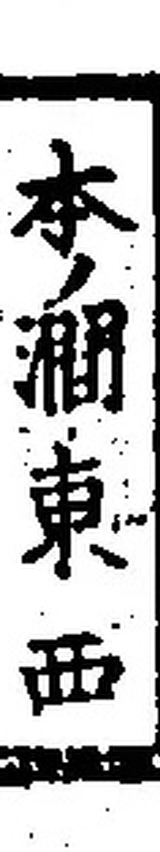本ノ澗東西
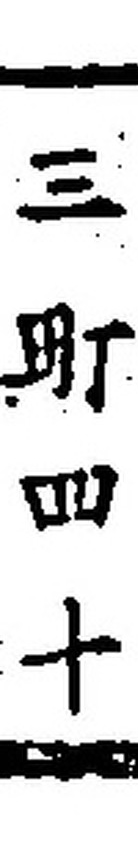三町四十
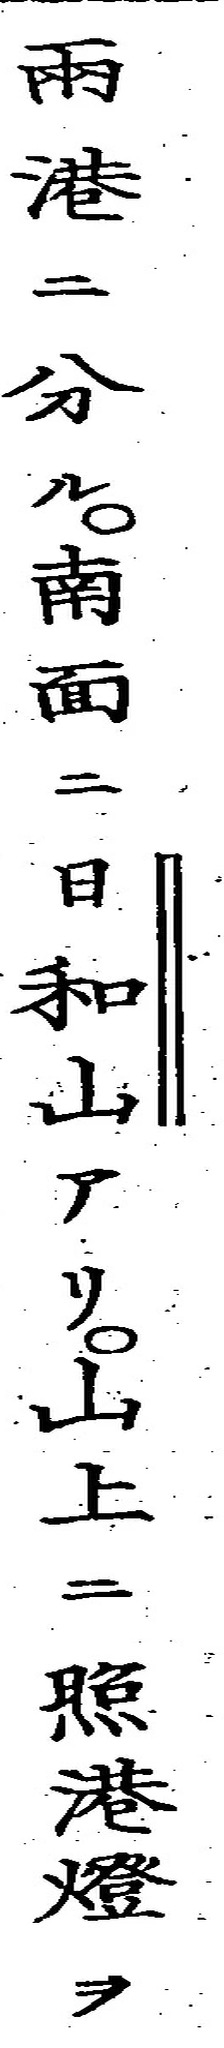両港ニ分ル。南面ニ日和山アリ。山上ニ照港灯ヲ
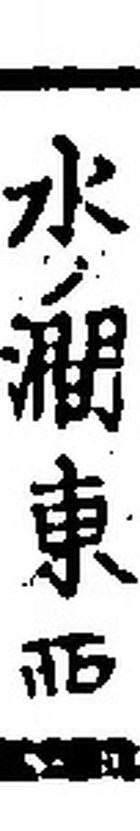水ノ澗東西
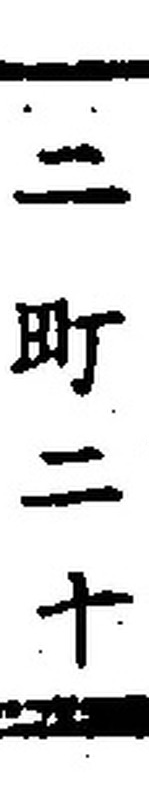二町二十
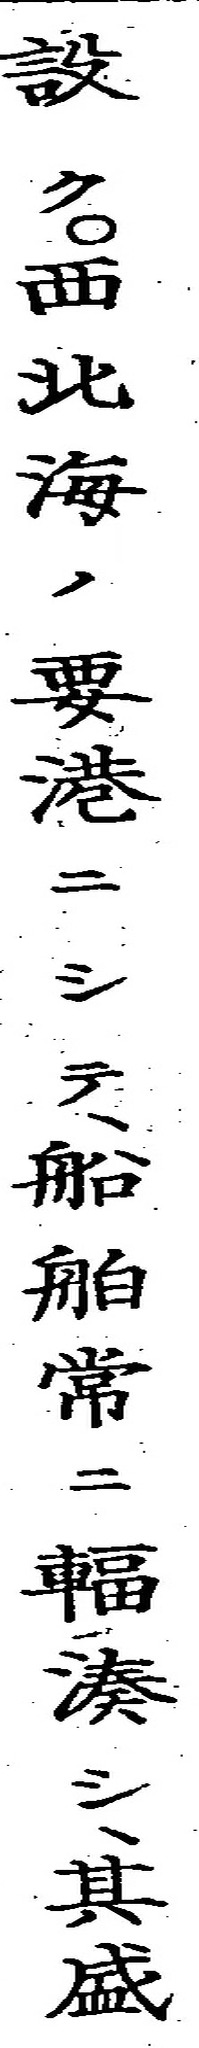設ク。西北海ノ要港ニシテ、船舶常ニ輻湊シ、其盛
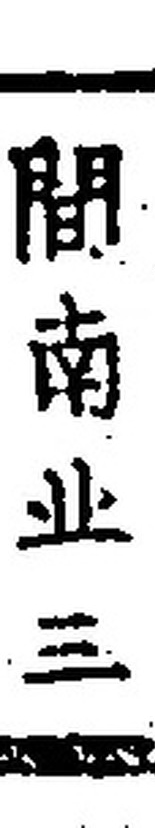間南北三
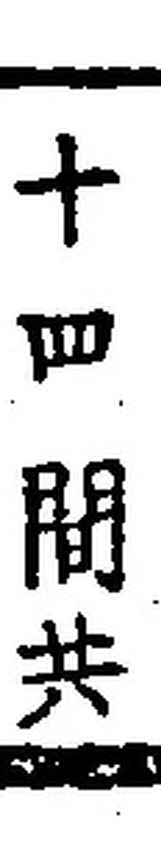十四間共
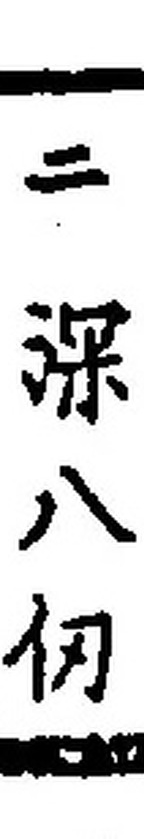ニ深八仞
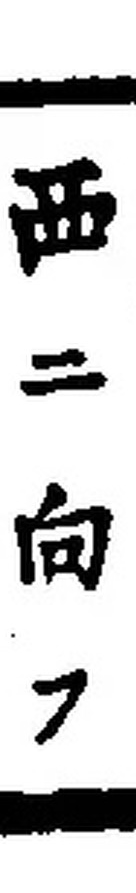西ニ向フ
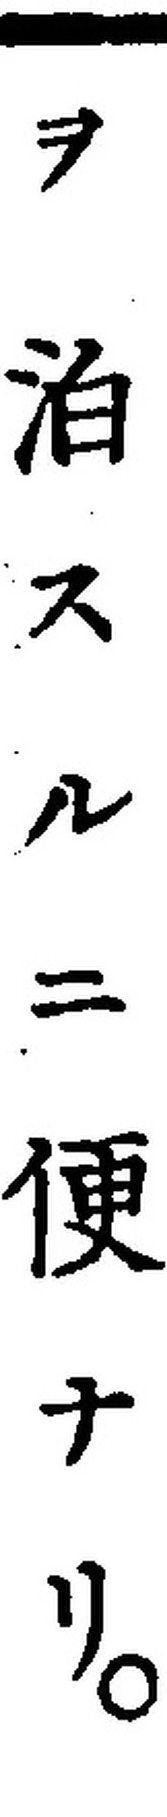ヲ泊スルニ便ナリ。
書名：能登地誌略
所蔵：国立国会図書館 National Diet Library, JAPAN
